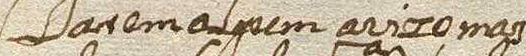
Darem algum avizo, mas
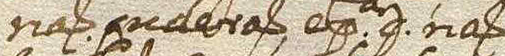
naõ puderaõ, e p.a q̄ naõ
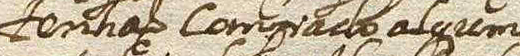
tenhaõ comprado algum
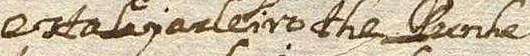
estalayadeiro the Punhe
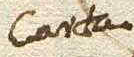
Carta
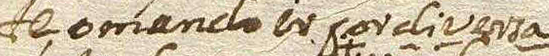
te, o mando ir por diversa
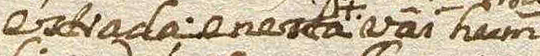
estrada; e nesta + vai hum
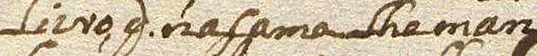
Livro, q̄ na cama lhe man
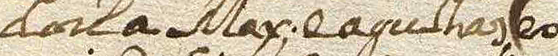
dou a May; e agulhas, e o
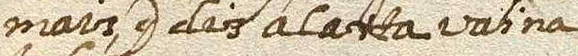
mais, q̄ dis a carta vai na
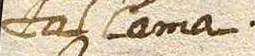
tal cama.
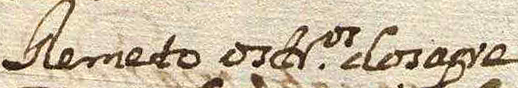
Remeto os tr.os dos apre
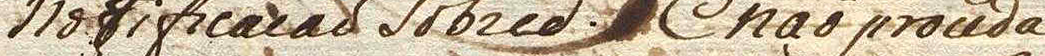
notificaçaõ sobred.a E naõ proceda
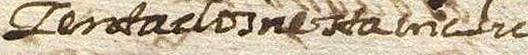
zentados nesta inclu
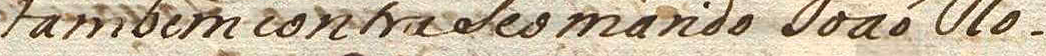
tambem contra seo marido Ioaõ Ro
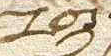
zos.
